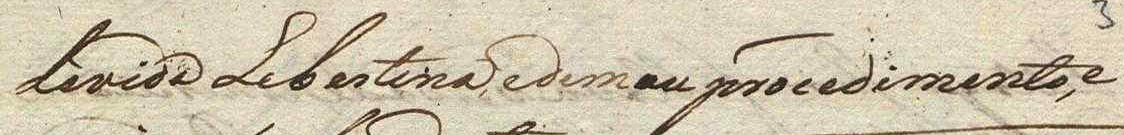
devida Lebertina, e de mau procedimento, e
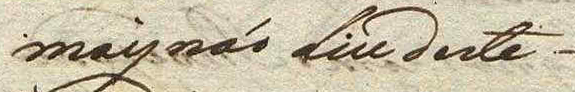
mais naõ dice deste
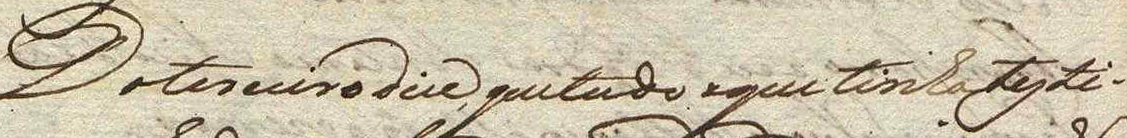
Do terceiro dice, que tudo o que tinha teste
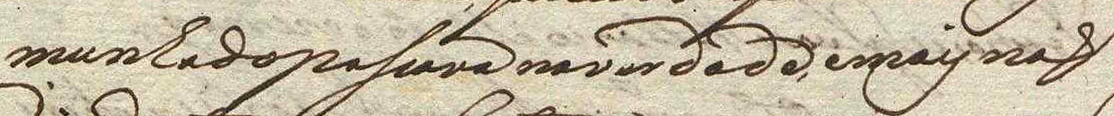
munhado passava na verdade, e mais naꝭ
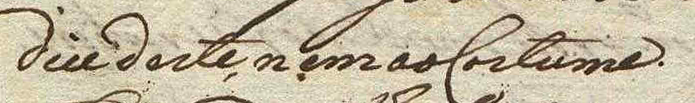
dice deste, nem ao Costume.
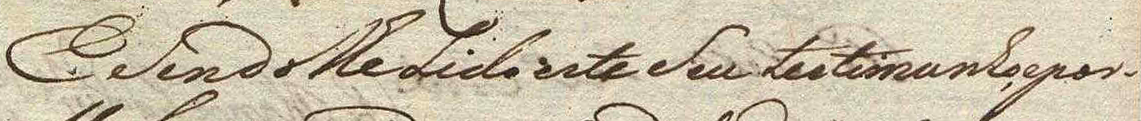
E Sendolhe Lido este Seu testimunho, e por
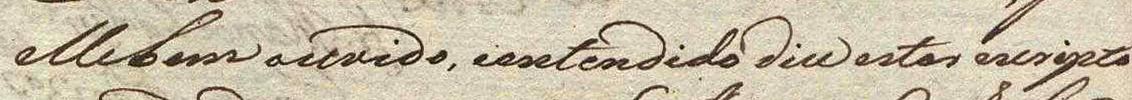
elle bem ouvido, e entendido dice estar escripto
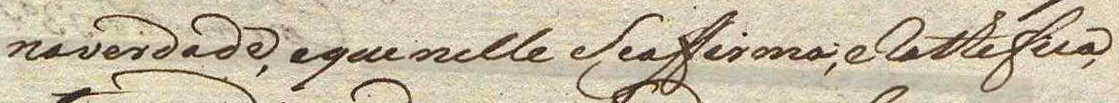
na verdade, e que nelle Se affirma; e Rathefica,
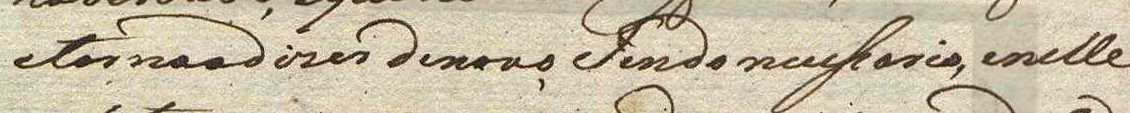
e torna a dizer de novo, Sendo necessario, e nelle
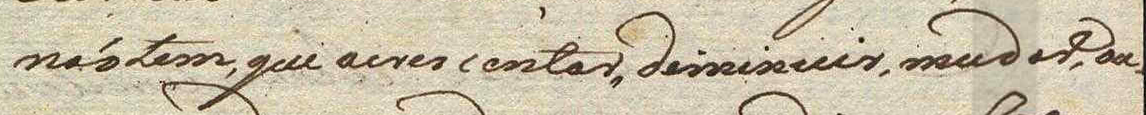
naõ tem, que acrescentar, diminuir, mudar, ou
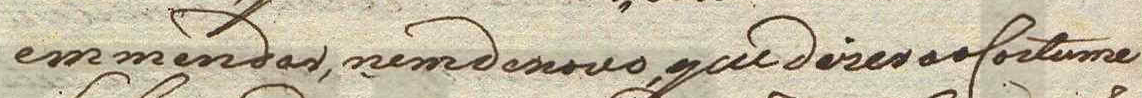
emmendar, nem de novo que dizer ao Costume
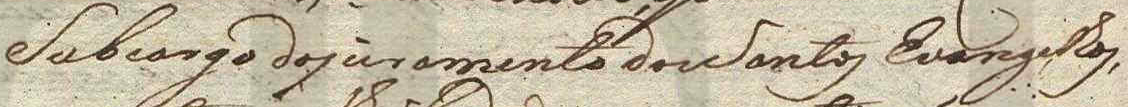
Subcargo do juramento dos Santos Evangelhos,
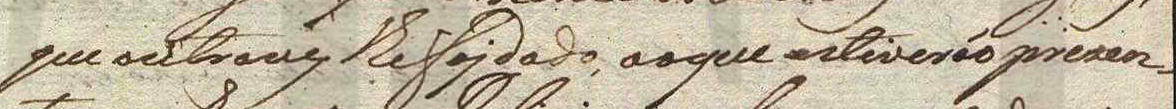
que outra ves lhe foj dado, ao que estiveraõ prezen
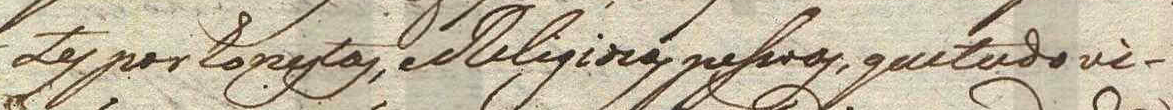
des por honestas, e Religiozas pessoas, que tudo vi
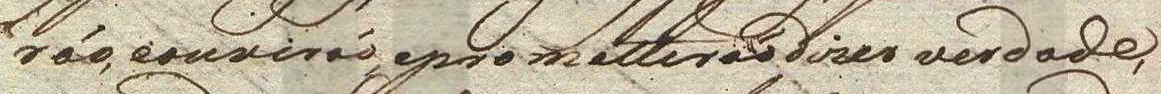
raõ, e ouviraõ e prometteraõ dizer verdade,
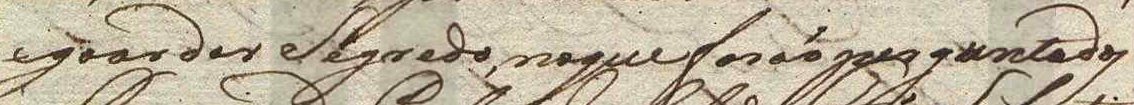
e goardar Segredo, no que foraõ perguntados
